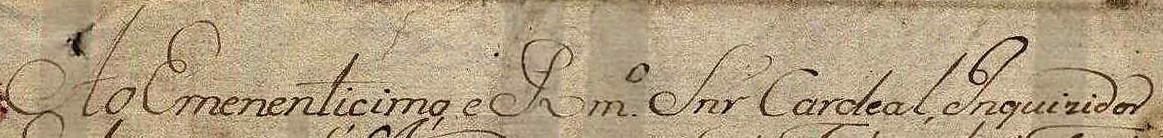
Ao Emenenticimo, e R m.o Snr̄ Cardeal, Inquizidor
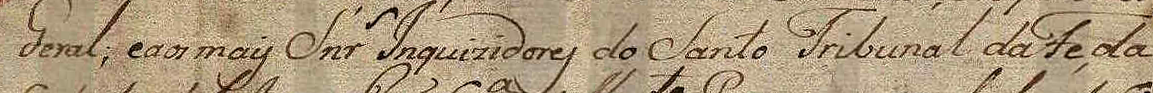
Geral, e aos mais Snr̄s Inquizidores do Santo Tribunal da Fe, da
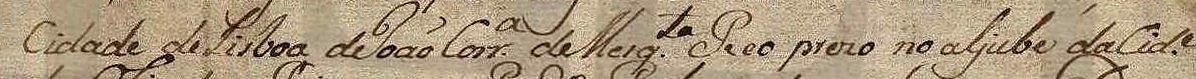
Cidade de Lisboa de Ioaõ Corr.a de Mesq.ta Reo prezo no aljube da Cid.e
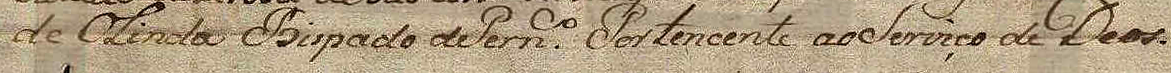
de OLinda Bispado de Pern.co Portencente ao Serviço de Deos.
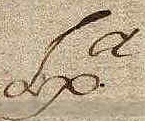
Lx.a
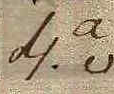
4.a
